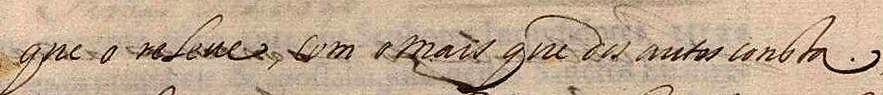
que o releue, com o mais que dos autos consta.
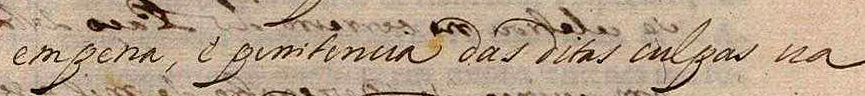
em pena, e penitencia das ditas culpas ua
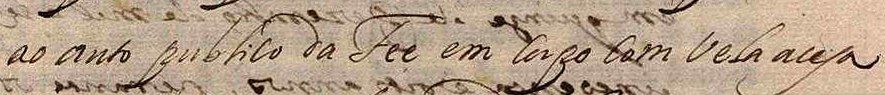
ao auto publico da Fee em corpo com vela acesa
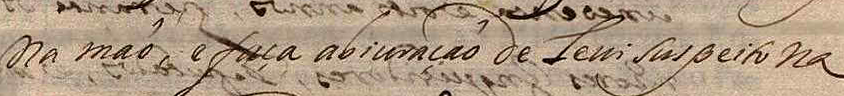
na maõ, e faça abiuração de Leui suspeito na
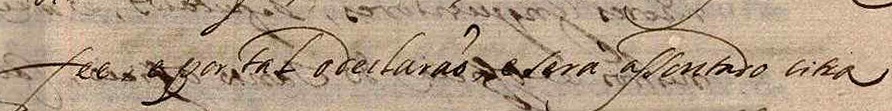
fee e por tal o declaraõ e sera assoutado citra
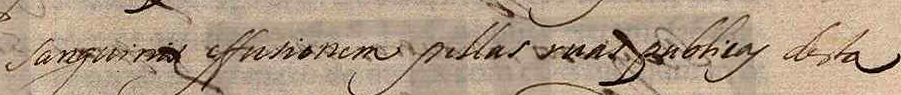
sanguinis effusionem pellas ruas publicas desta
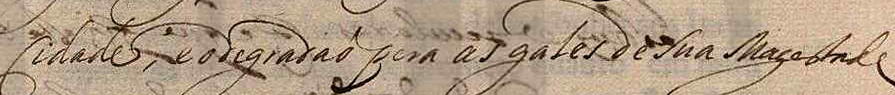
Cidade, e o degradaõ pera as gales de Sua Magestade
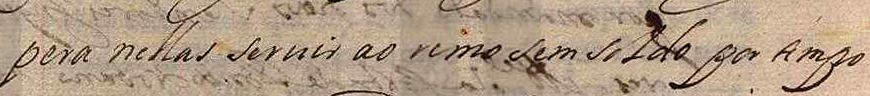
pera nellas seruir ao remo sem soldo por tempo
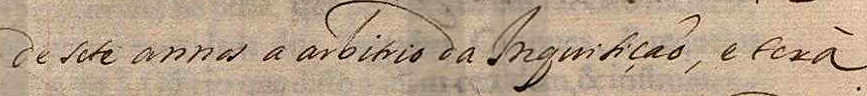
de sete annos a arbitrio da Inquisiçaõ, e terà
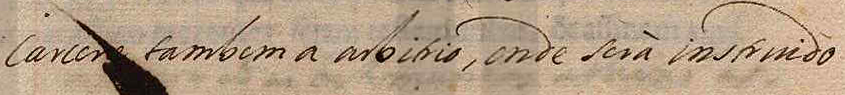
carcere tambem a arbitrio, onde serà instruido
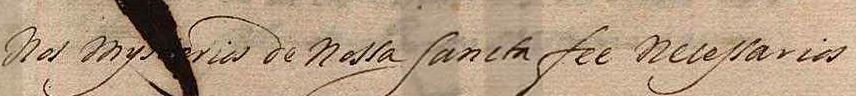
nos mys_erios de nossa Sancta fee necessarios
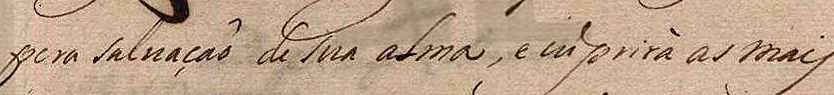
pera saluaçaõ de sua alma, e cūprirà as mais
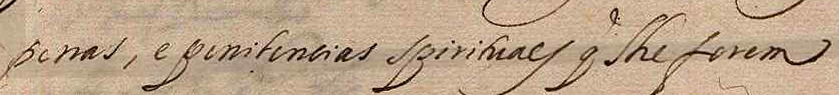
penas, e penitencias spirituaes q̄ lhe forem
